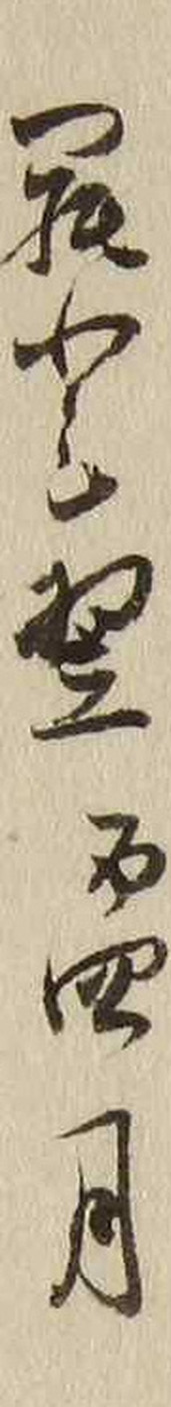罷登翌酉四月
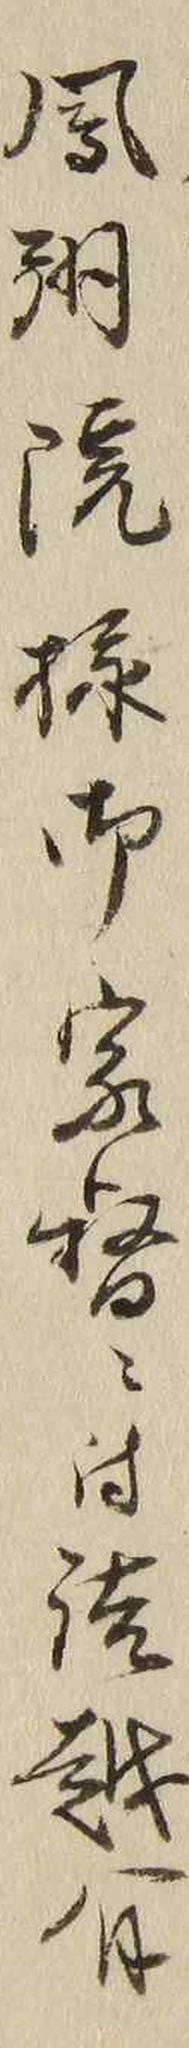鳳翔院様御家督ニ付詰越八月
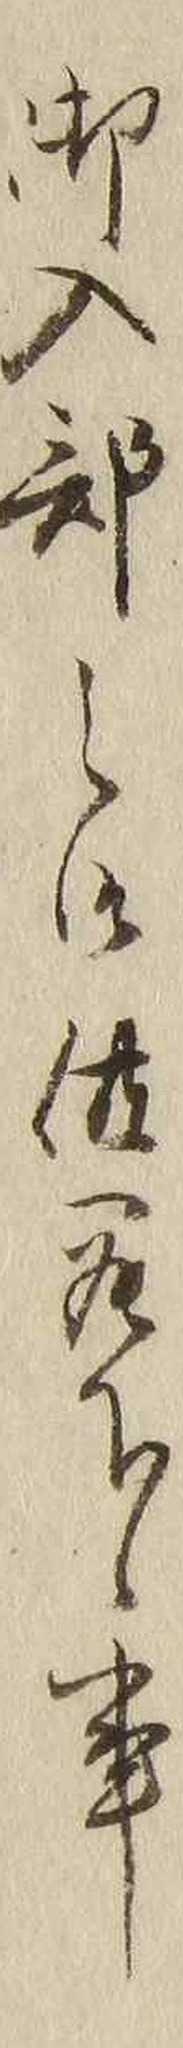御入部之御供罷下候事
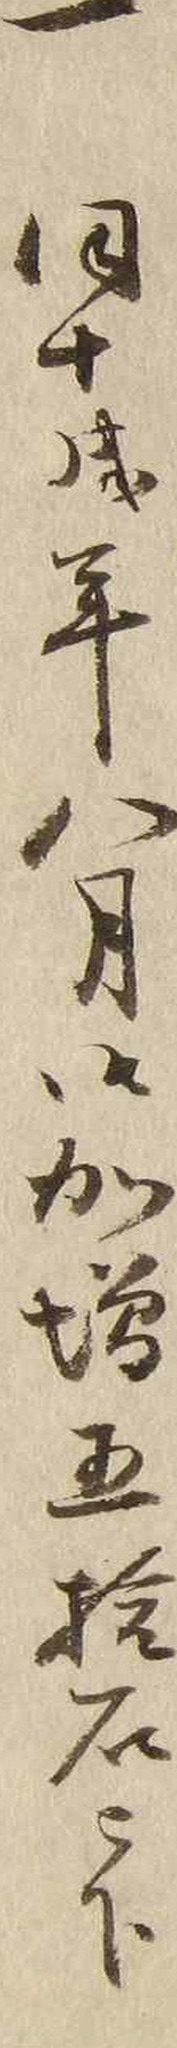一同十戌年八月御加増五拾石被下

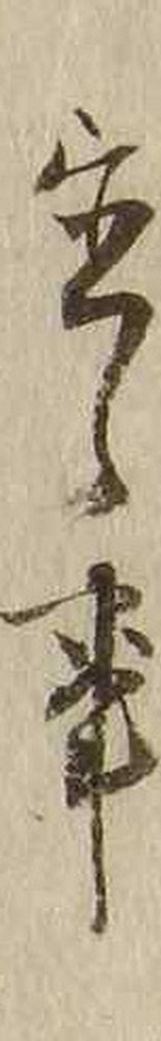置候事
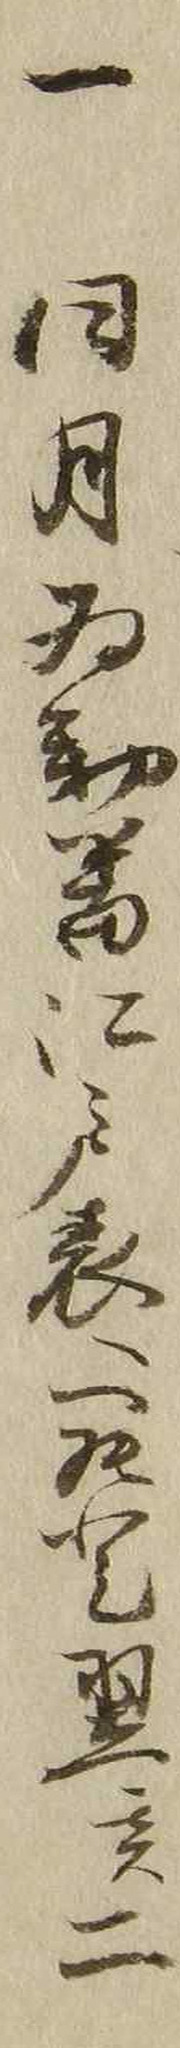一同月為勤番江戸表へ罷登翌亥二
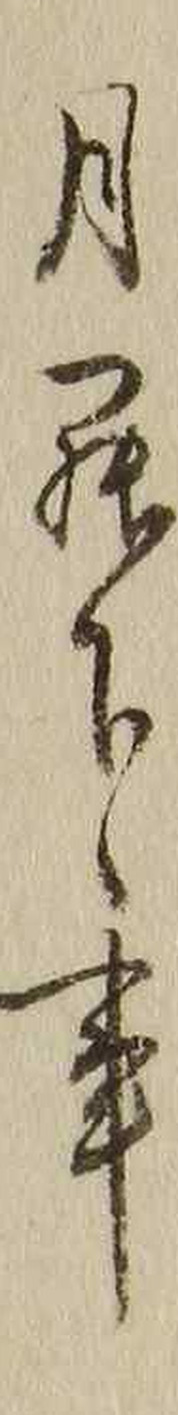月罷下候事
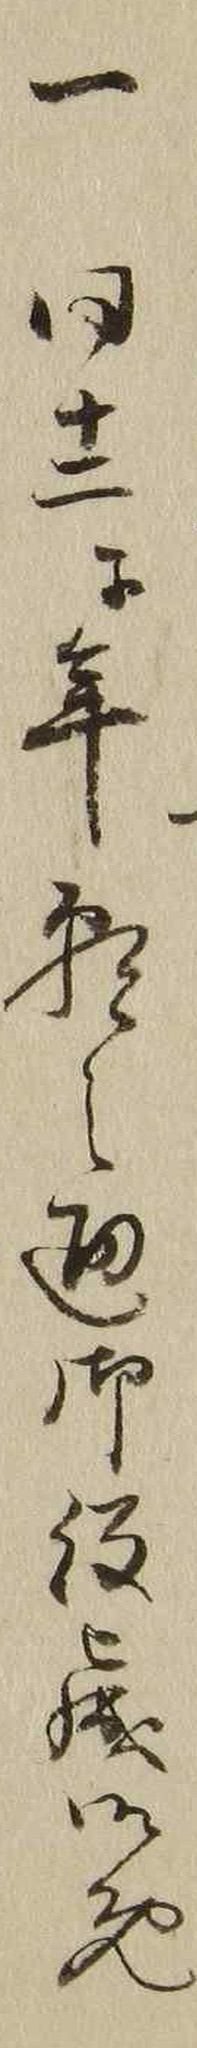一同十二子年願之通御役被成御免
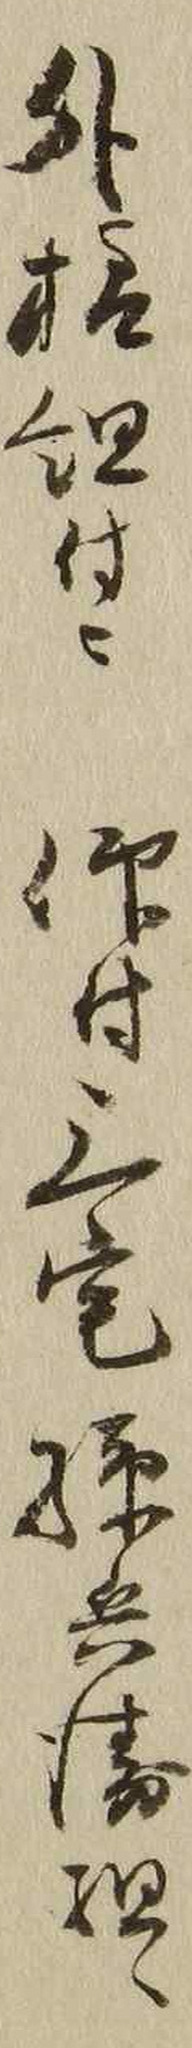外様組付被仰付三宅孫兵衛組へ
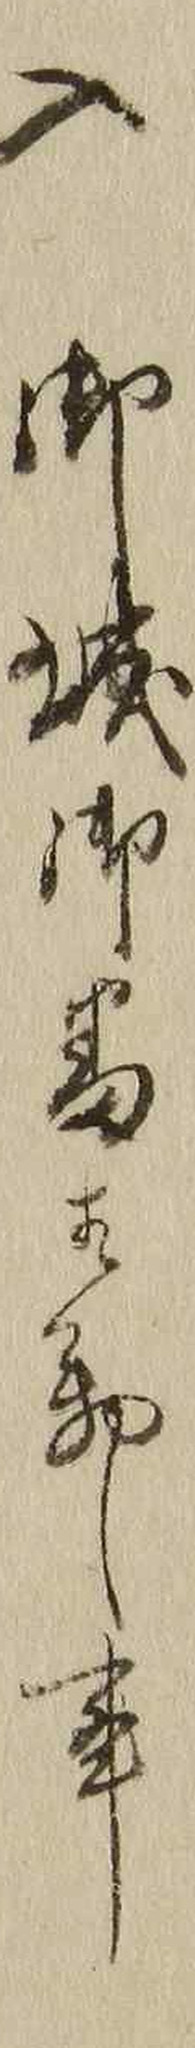入御城御番相勤候事
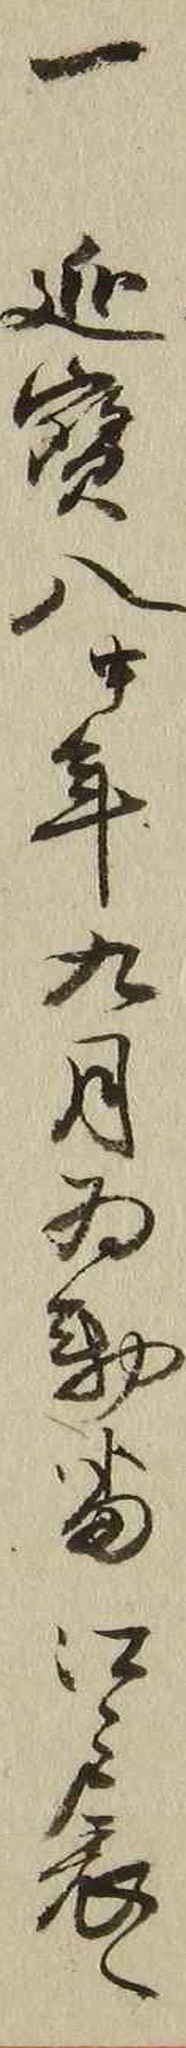一延宝八申年九月為勤番江戸表へ
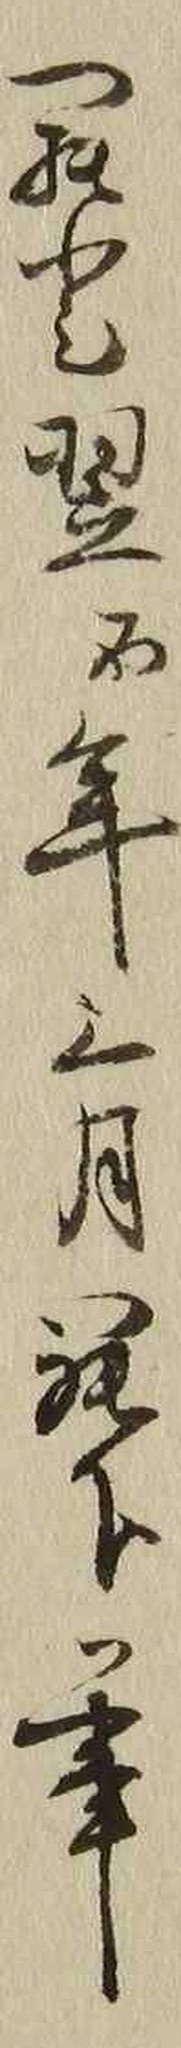罷登翌酉年三月罷下候事
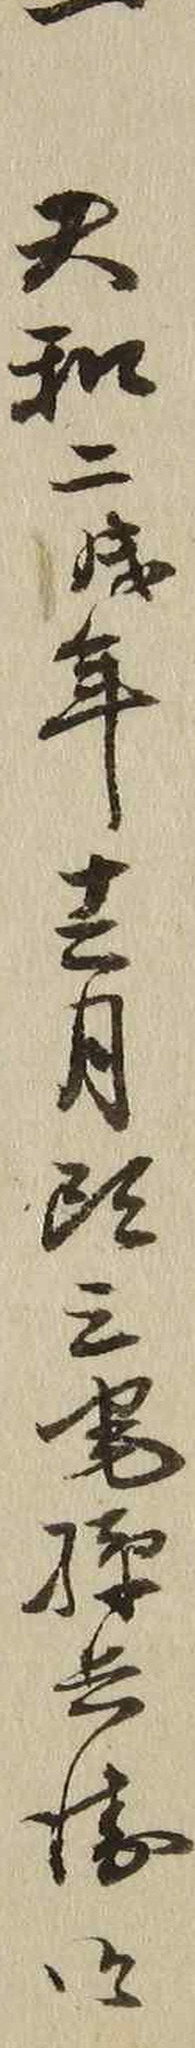一天和二戌年十二月頭三宅孫兵衛御
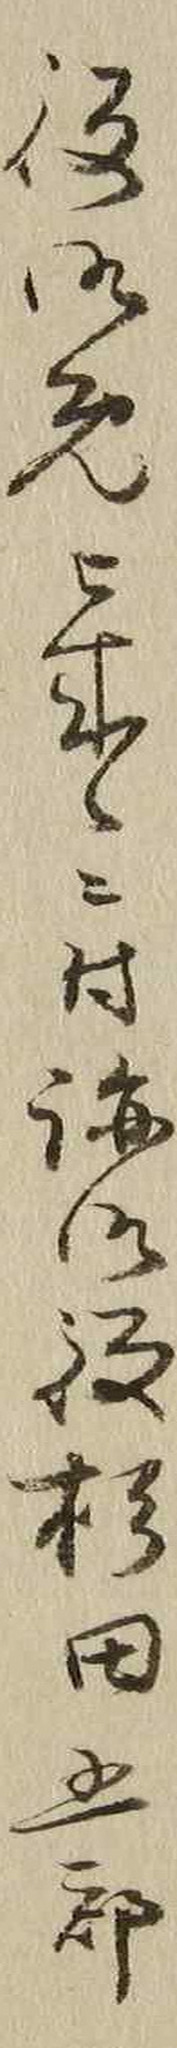役御免被成候ニ付跡御役杉田五郎
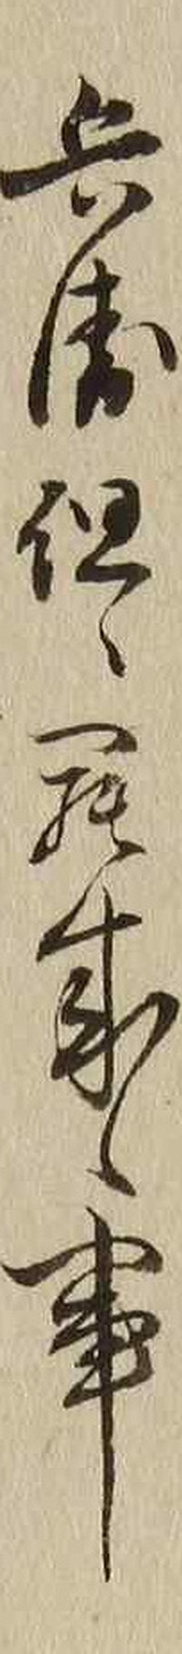兵衛組へ罷成候事
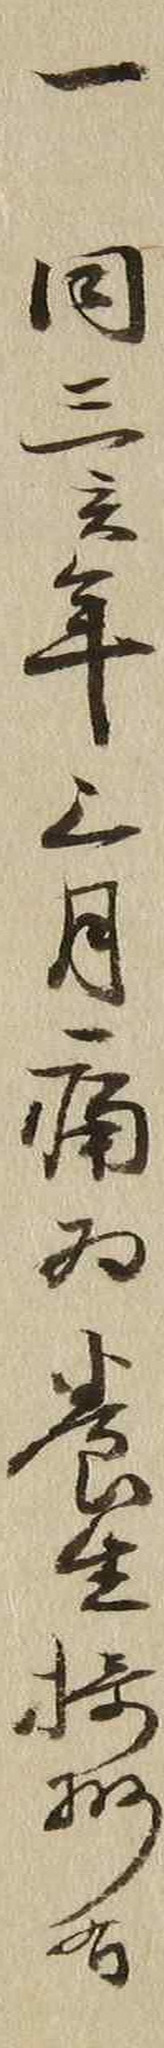一同三亥年三月痛為養生摂州有
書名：諸士系譜　巻之225　ま之部6
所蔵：会津若松市立会津図書館
